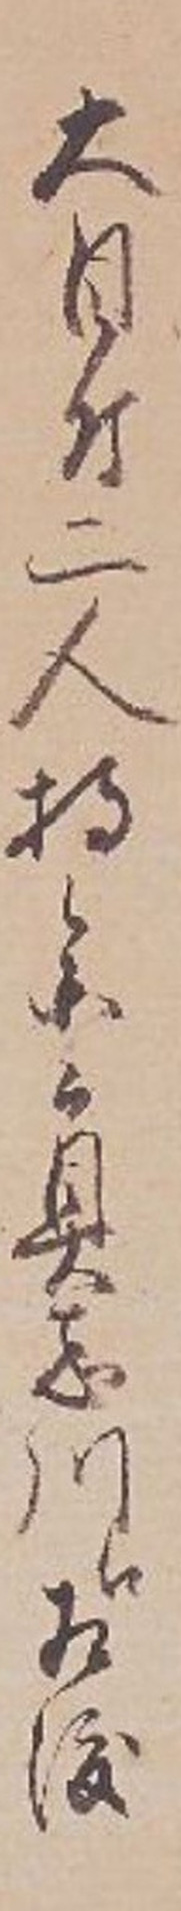大目付二人持参而具志川え相渡
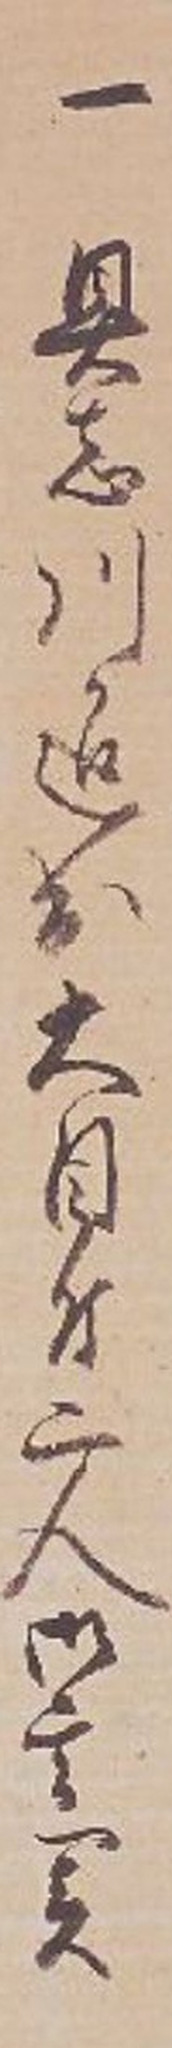一具志川退出大目付二人御玄関
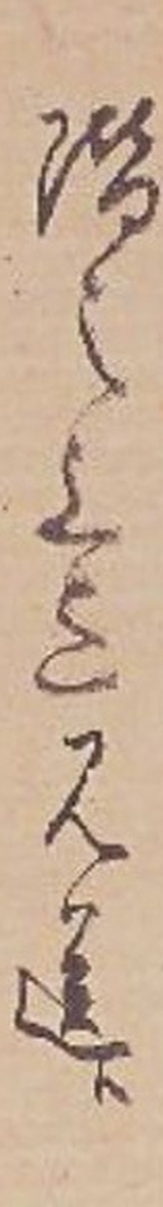階之上迄見送る
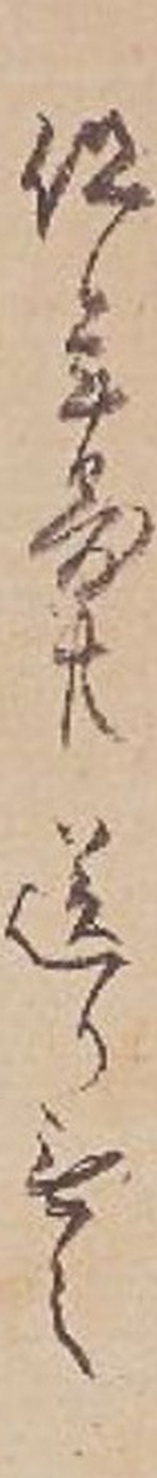但年寄共送り無之
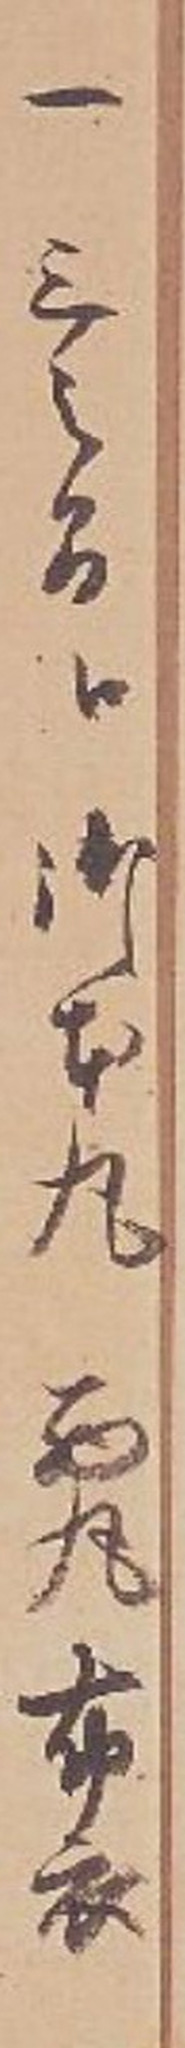一三之間え御本丸西丸布衣
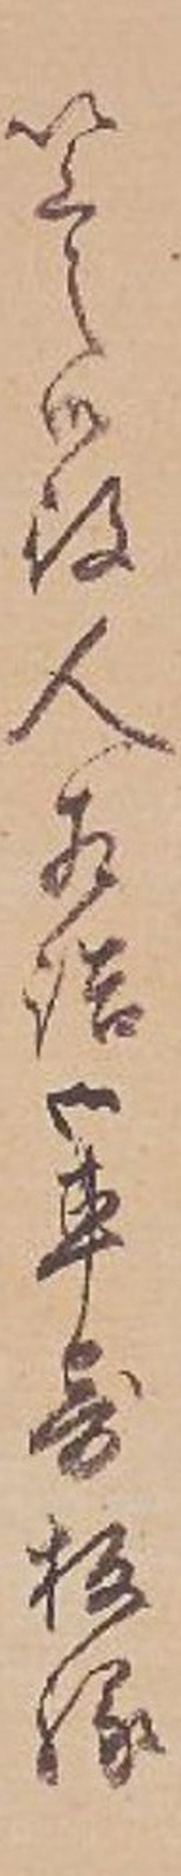以上之御役人相詰御車寄板縁
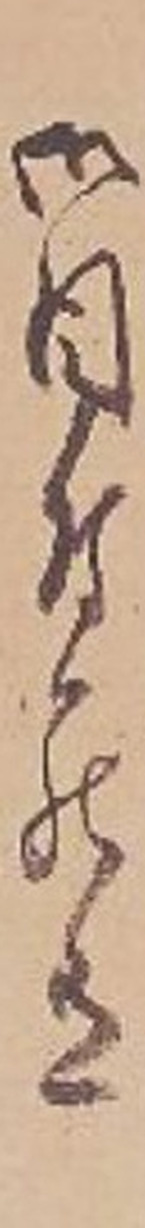御目付罷有
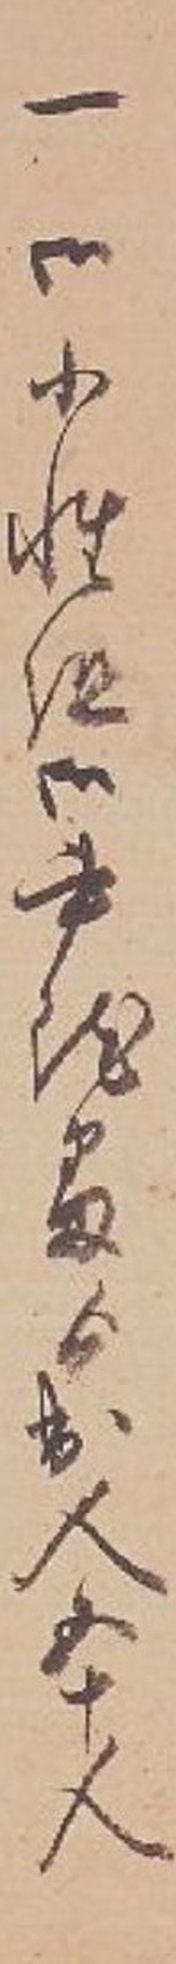一御小性組御書院番ゟ出人五十人
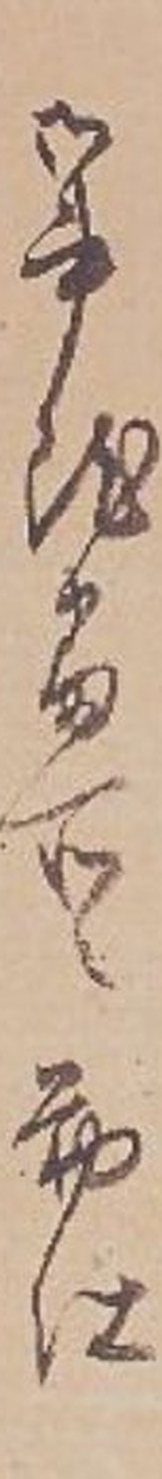御書院番所々勤仕
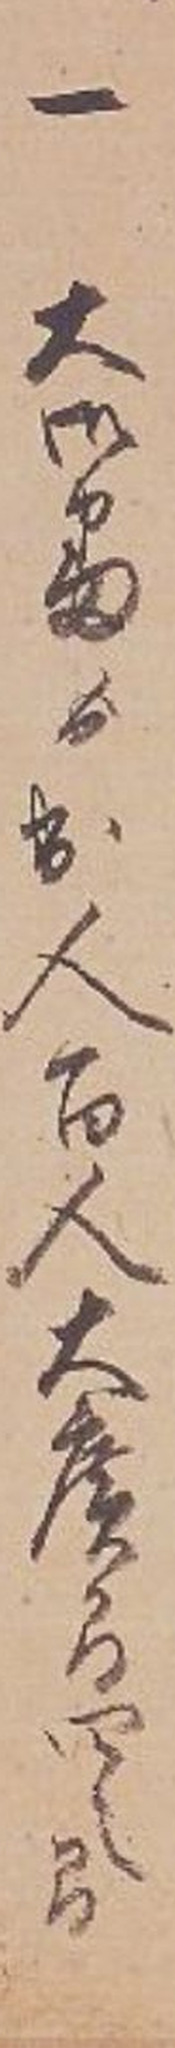一大御番ゟ出人百人大広間四之間

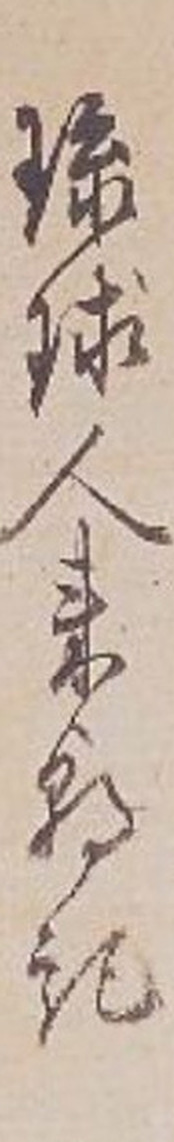琉球人来朝記
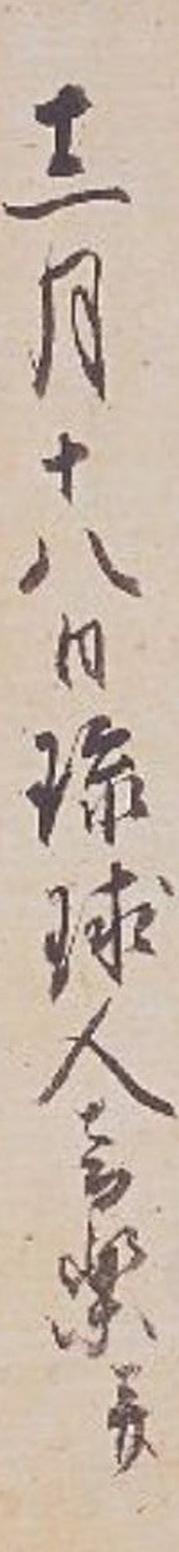十二月十八日琉球人音楽幷
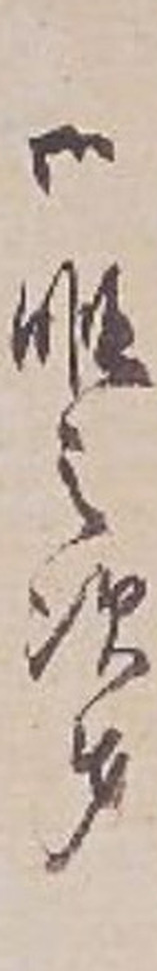御暇之次第
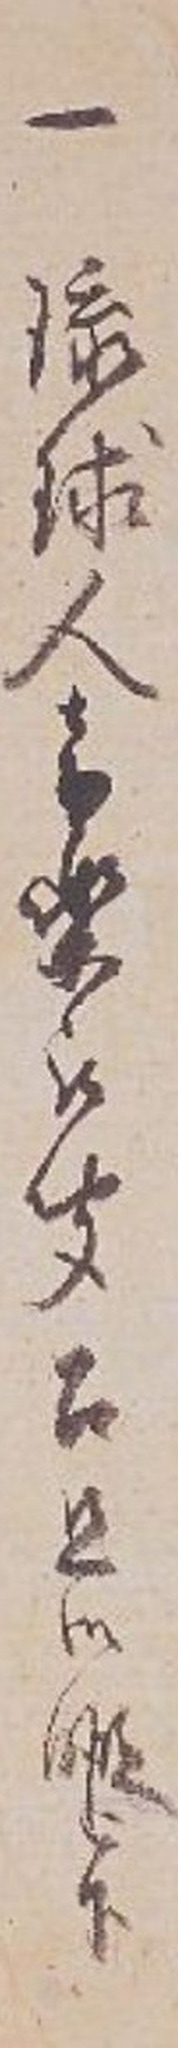一琉球人音楽被聞召且御暇被下
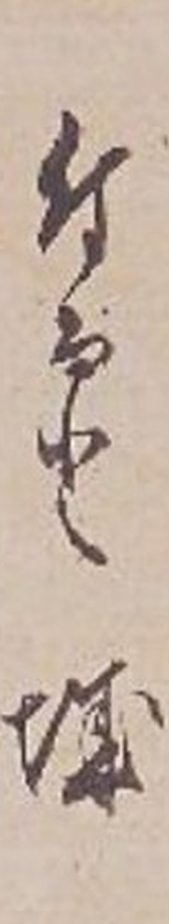付而登城
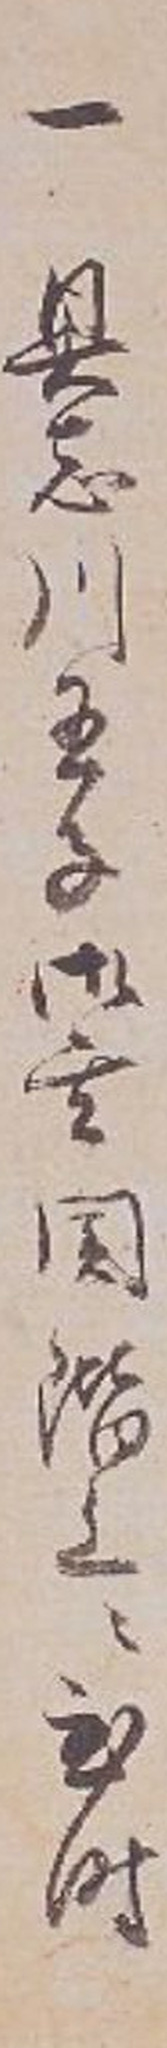一具志川王子御玄関階上に至時
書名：琉球人来朝記 八、九
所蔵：University of the Ryukyus Library
